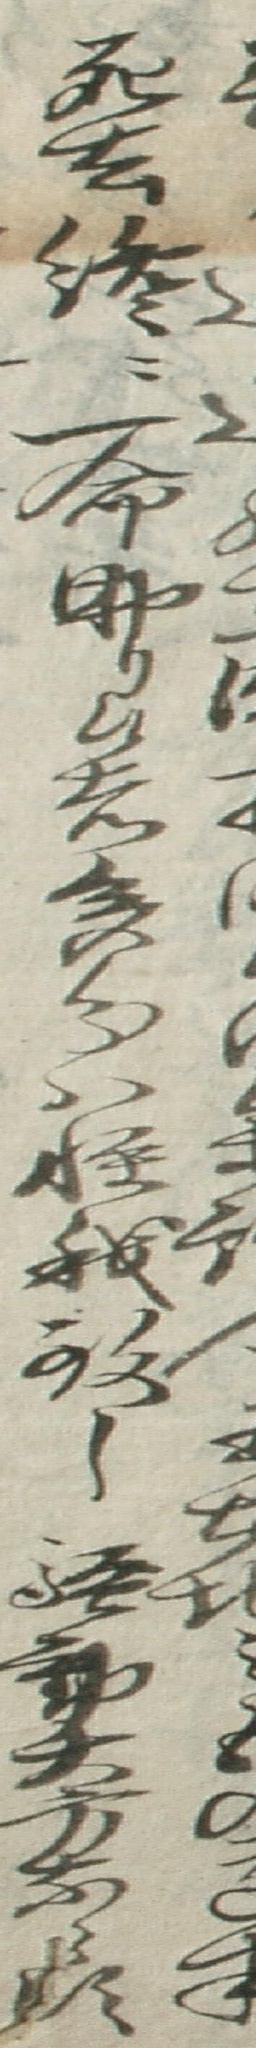死去終二一命助り候者多分ハ怪我致し騒動大方ならす
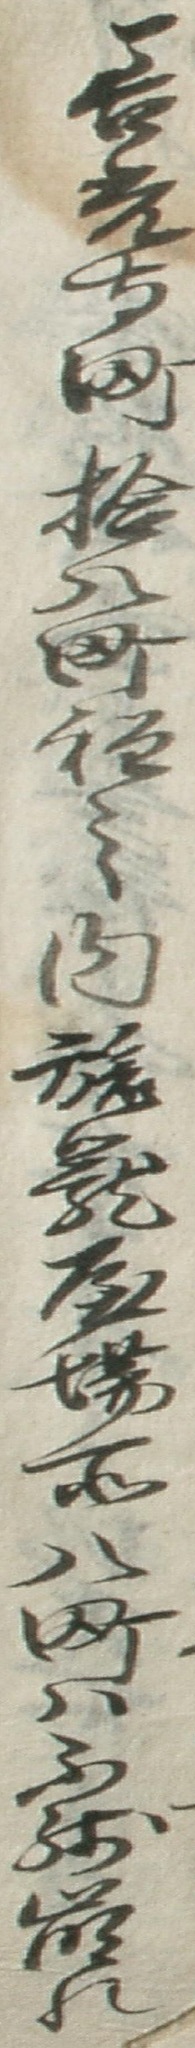善光寺町拾八町程之内旅籠屋場所八町ハ不残崩れ

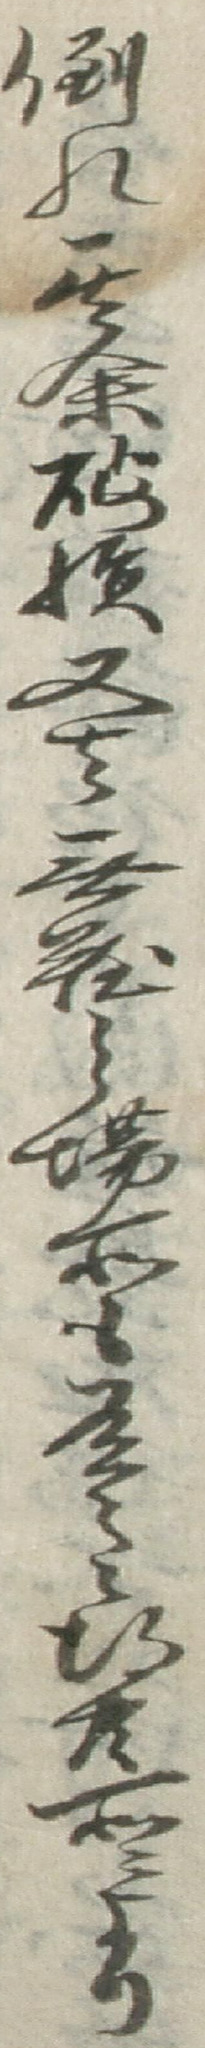倒れ其余破損又は無難之場所も有之候得共所二より
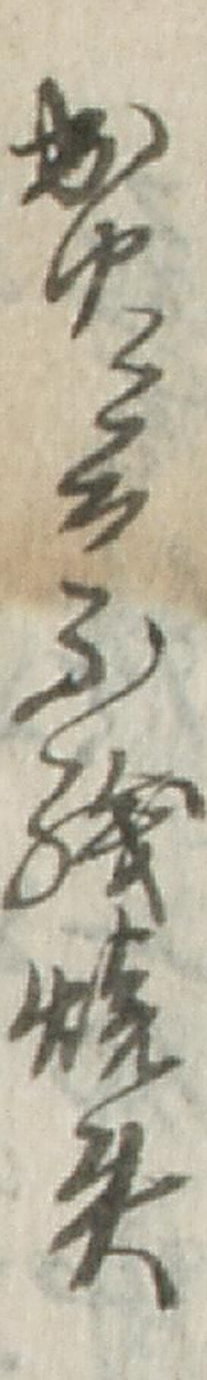出火二而不残焼失
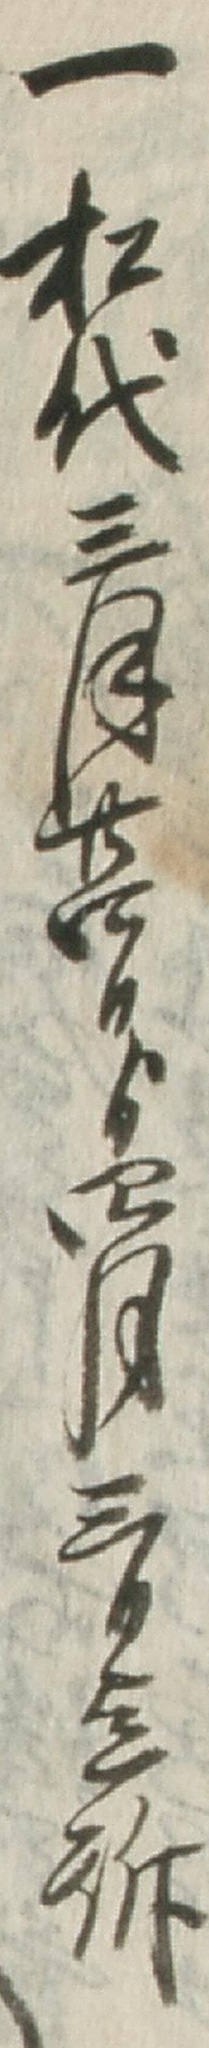松代三月廿四日ゟ四月三日迄訴
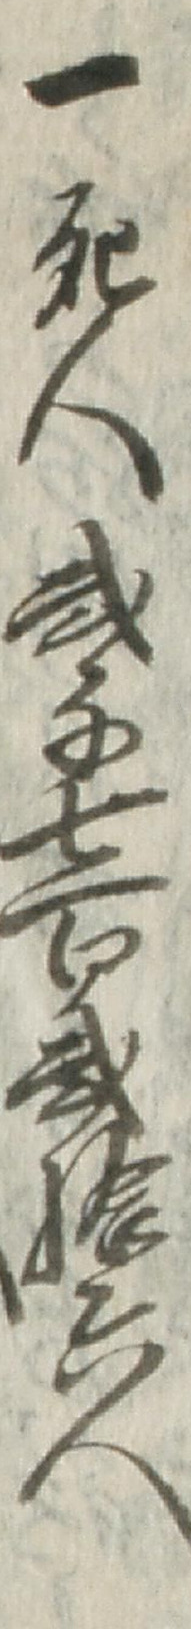一死人弐千七百弐拾六人
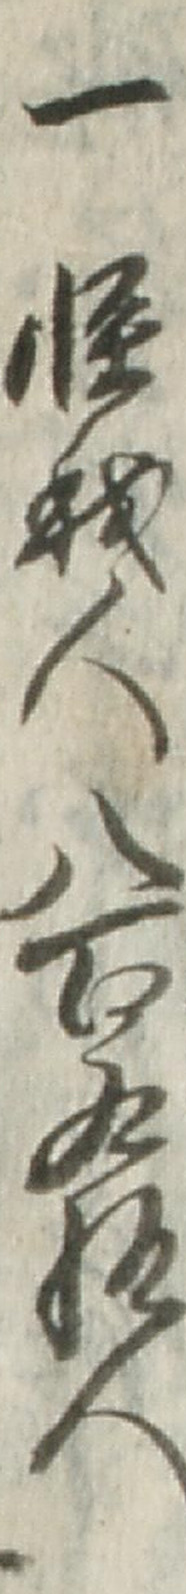一怪我人八百九拾人
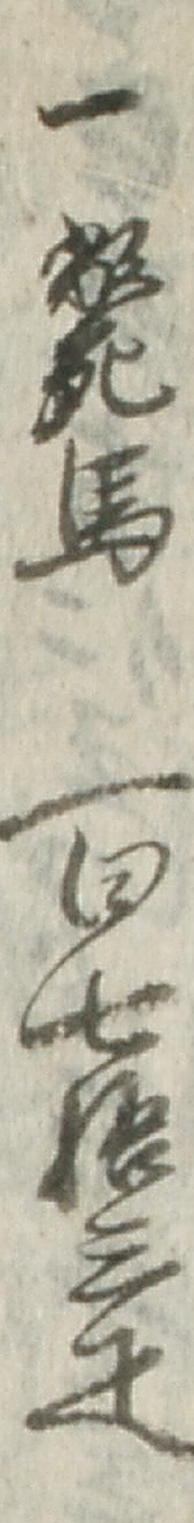一斃馬百七拾三疋
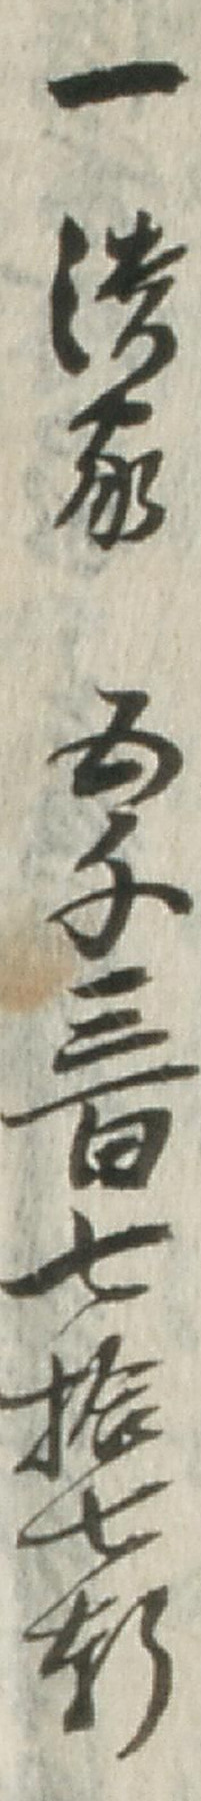一潰家五千三百七拾七軒
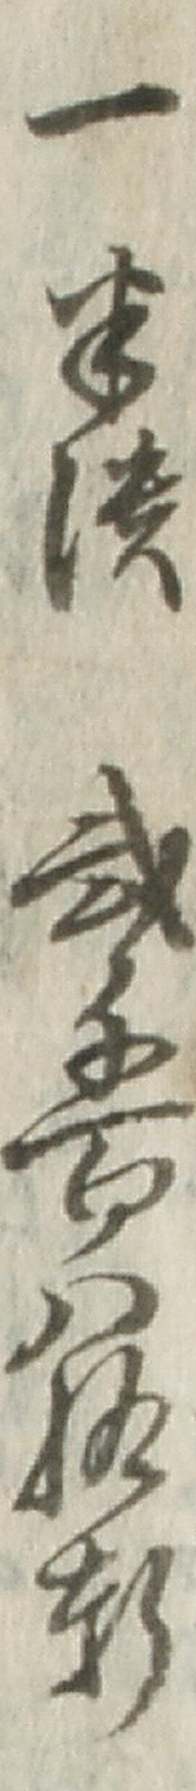一半潰弐千百八拾軒
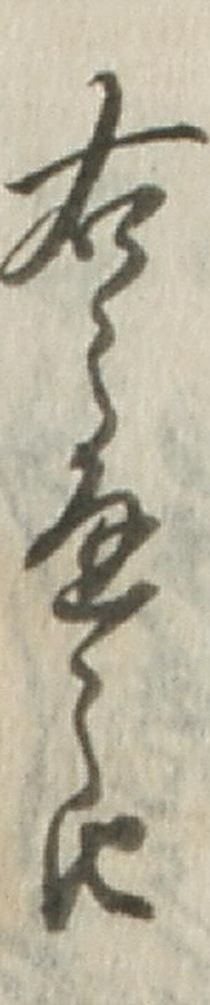右之通候由
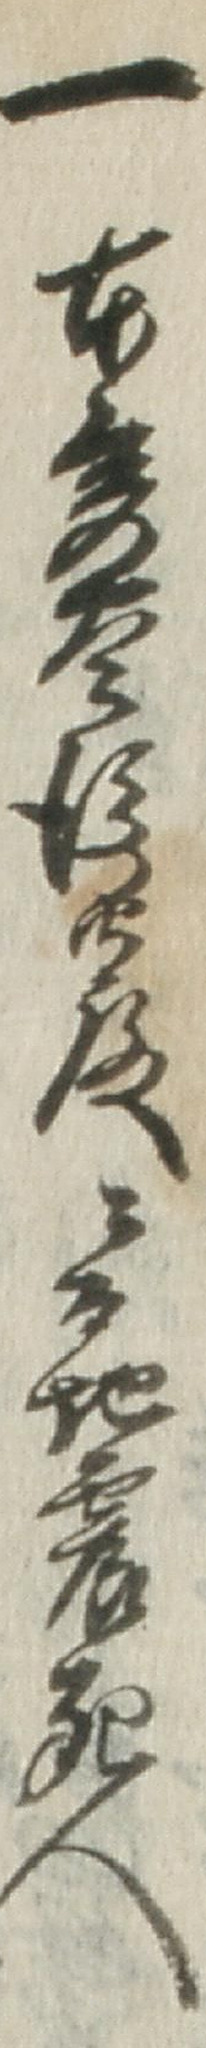一本多豊後守殿二而地震死人
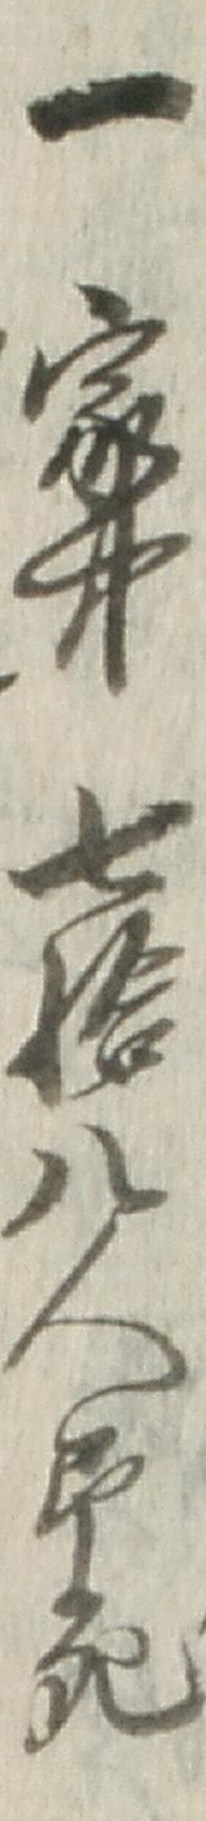一家中七拾八人即死
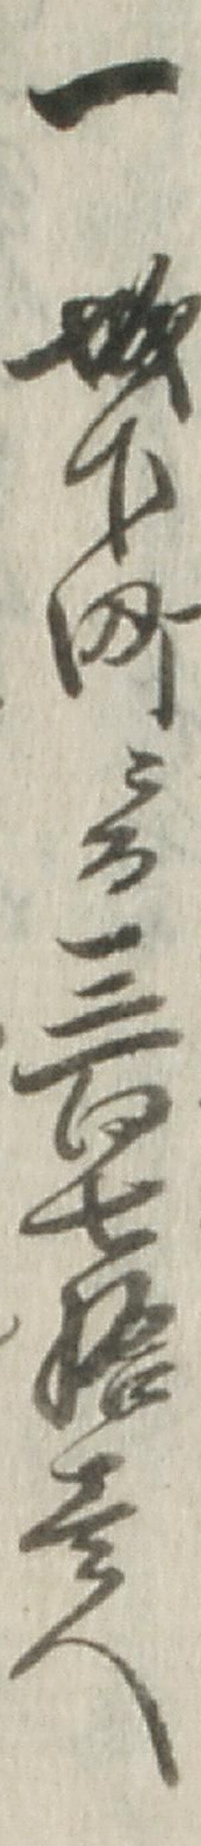一城下町二而三百七拾壱人
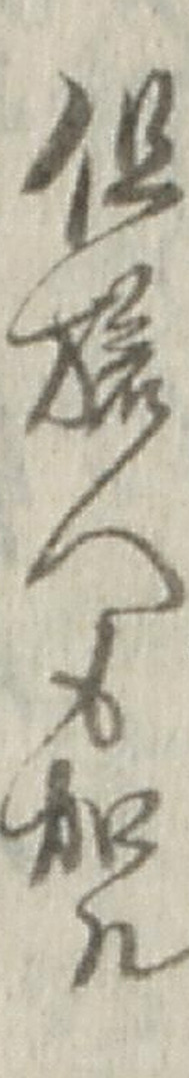但旅人も加ㇽ
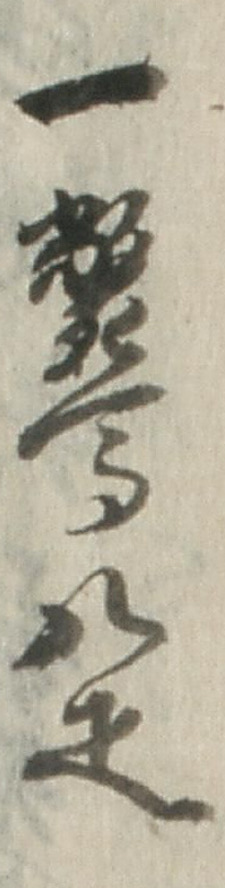一斃馬八疋
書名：信濃國地震實録記
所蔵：東京大学地震研究所図書室 Earthquake Research Institute Library, The University of Tokyo, JAPAN
